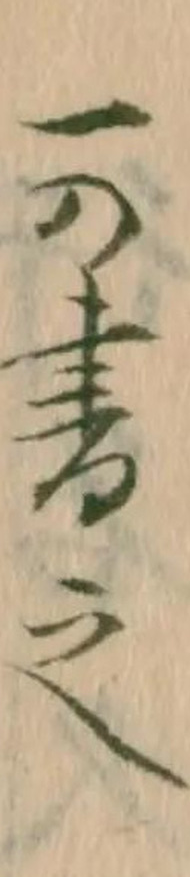可書之
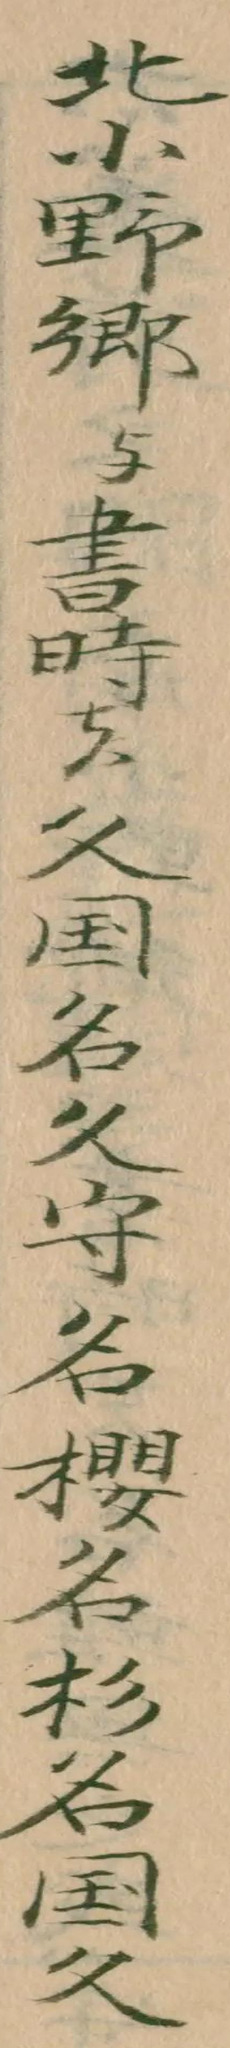一北小野郷与書時は久国名久守名桜名杉名国久
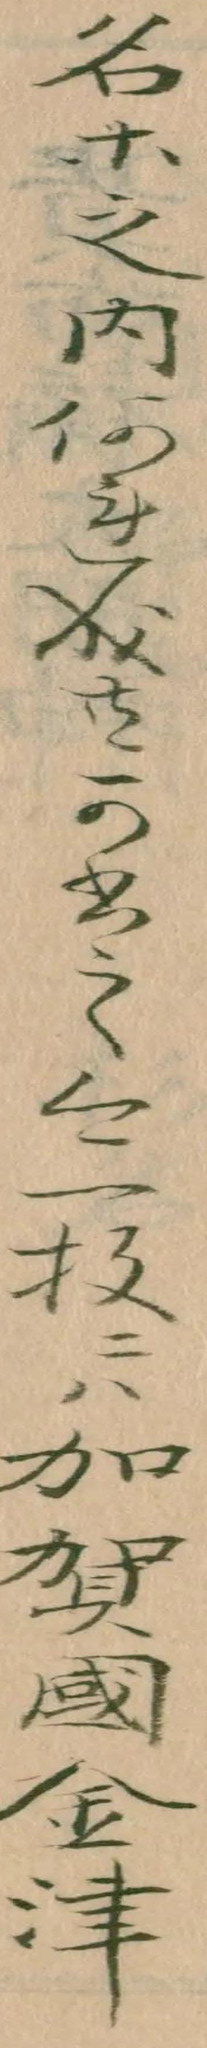名等之内何れ成共可書之今一枚ニハ加賀国金津
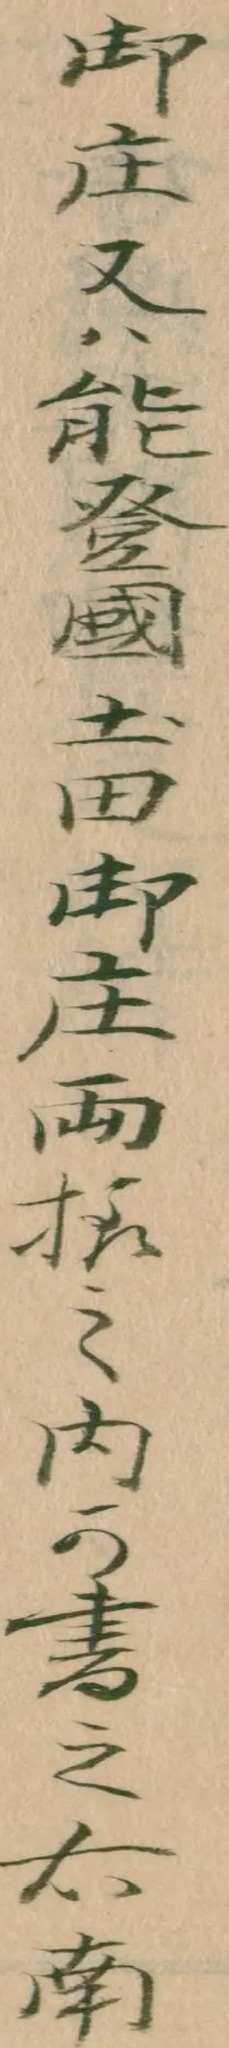御庄又ハ能登国土田御庄両様之内可書之右南
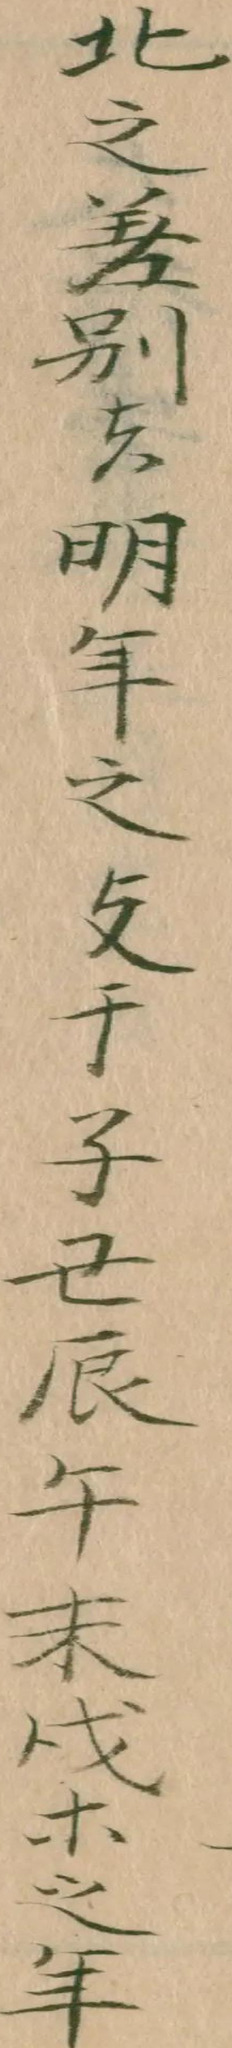北之差別は明年之支干子丑辰午未戌等之年
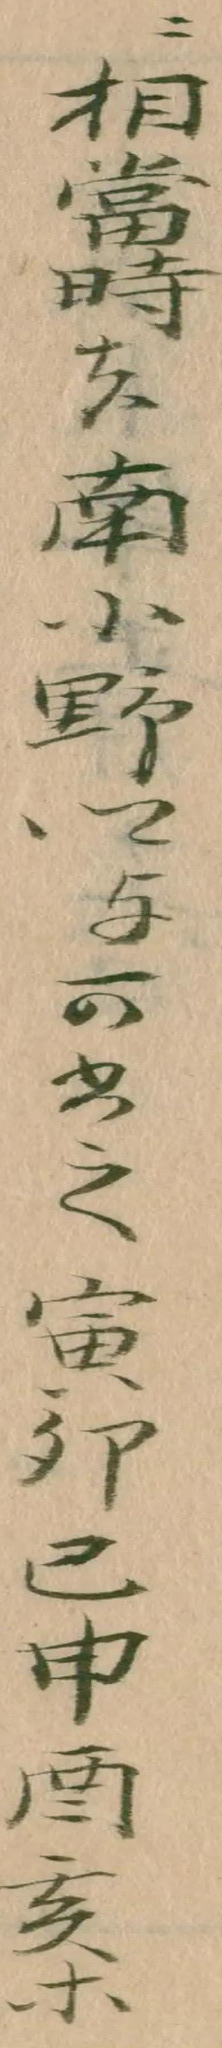ニ相当時は南小野郷与可書之寅卯巳申酉亥等
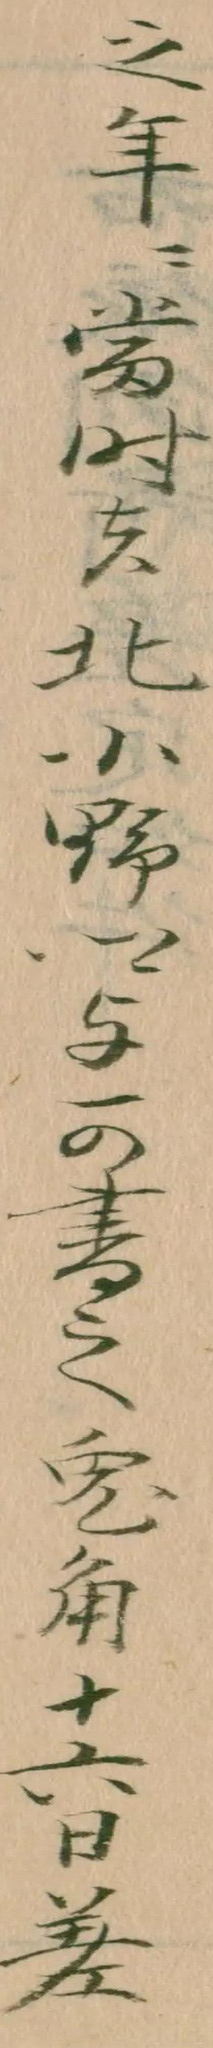之年ニ当時は北小野卿与可書之兎角十六日差
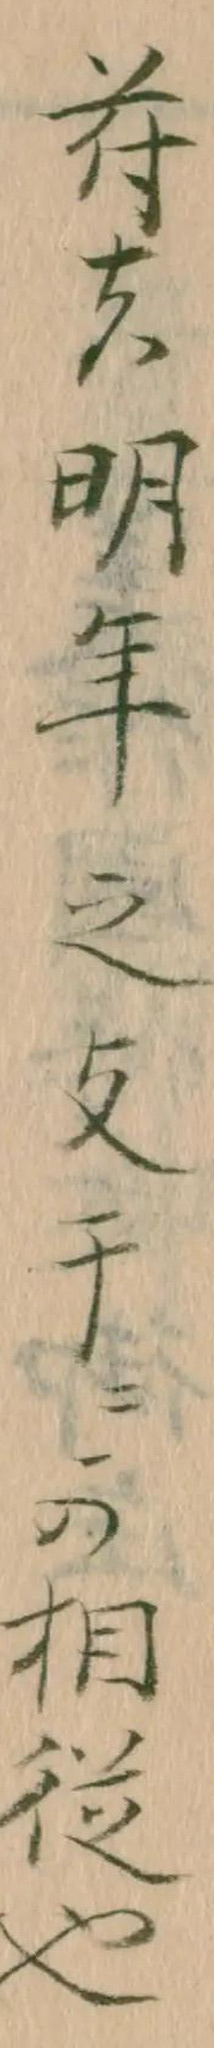符は明年之事之支干ニ可相従也
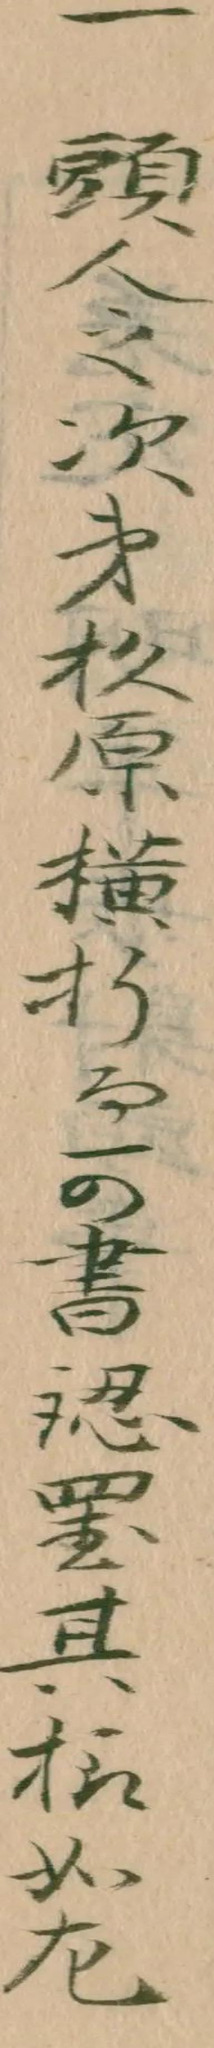一頭人之次第杉原横折而可書認置其様如左
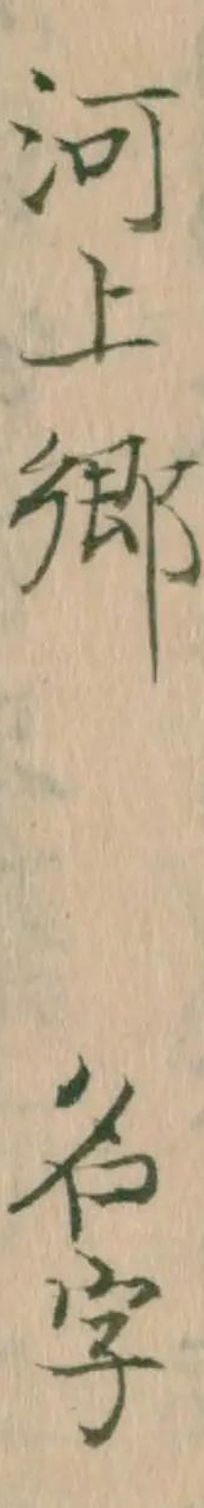河上郷名字
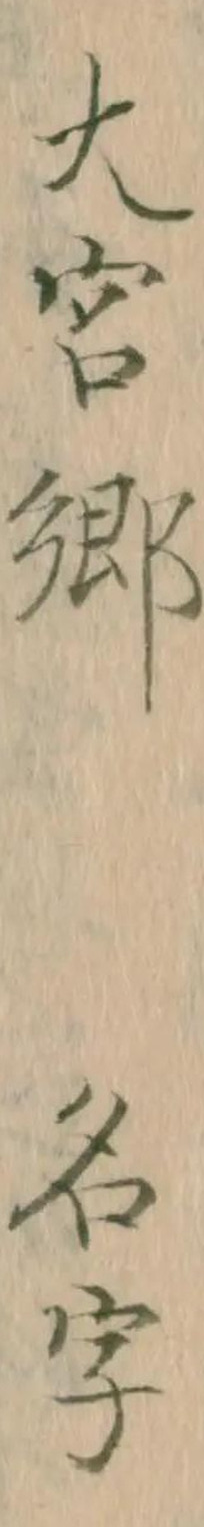大宮郷名字
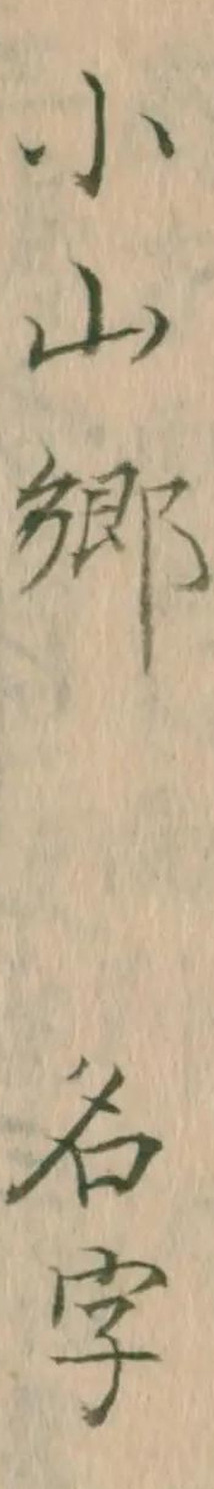小山郷名字
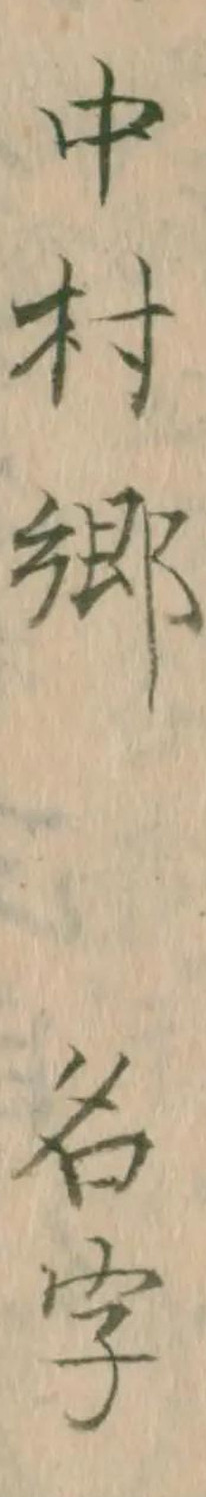中村郷名字
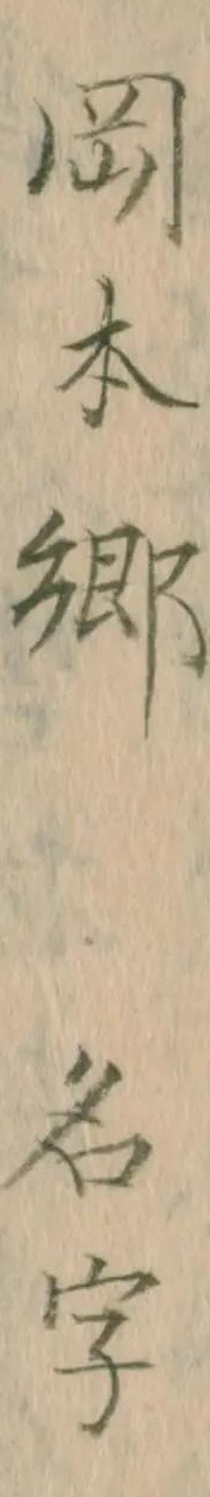岡本郷名字
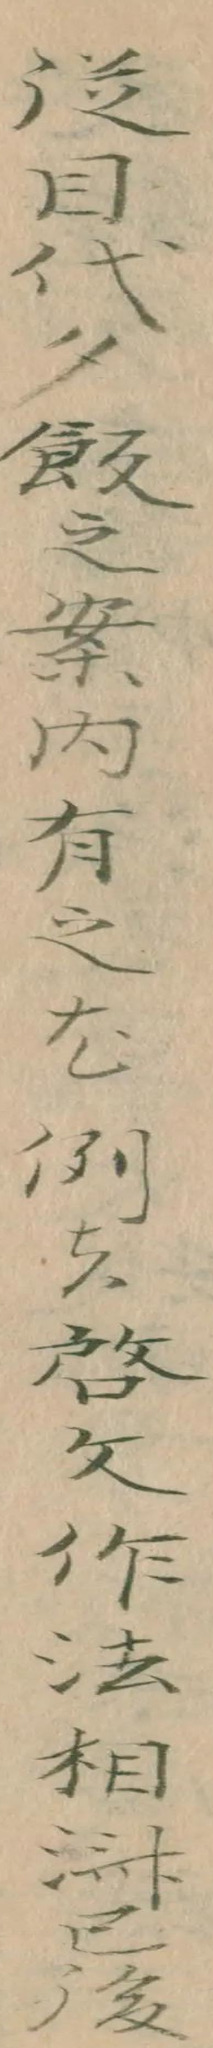一従目代夕飯之案内有之尤例は啓文作法相済已後
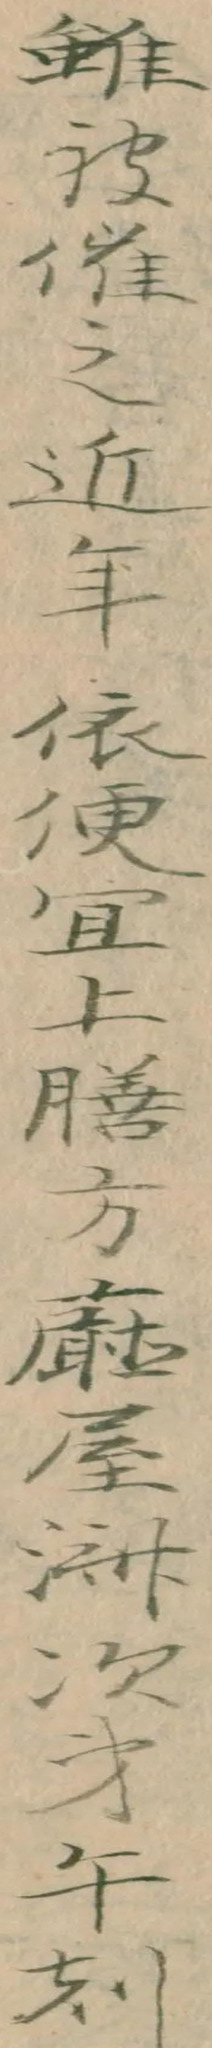雖被催之近年依使宜上膳方庁屋済次第午刻
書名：賀茂社記録. 第26冊
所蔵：国立国会図書館 National Diet Library, JAPAN
